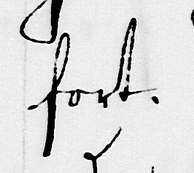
fort.
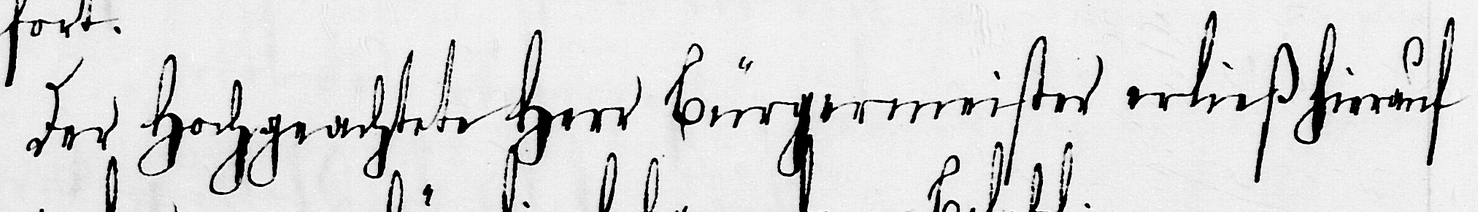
Der Hochgeachtete Herr Bürgermeister erließ hierauf
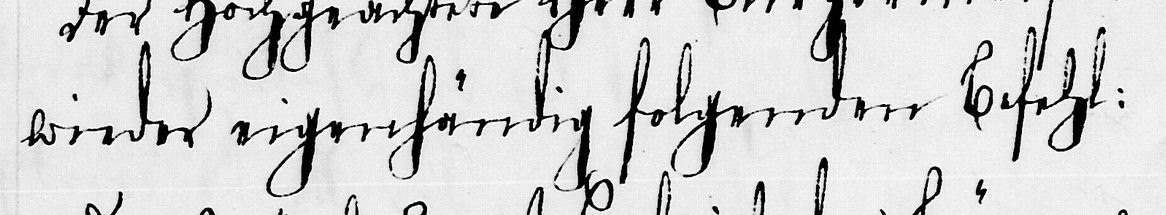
wieder eigenhändig folgenden Befehl:
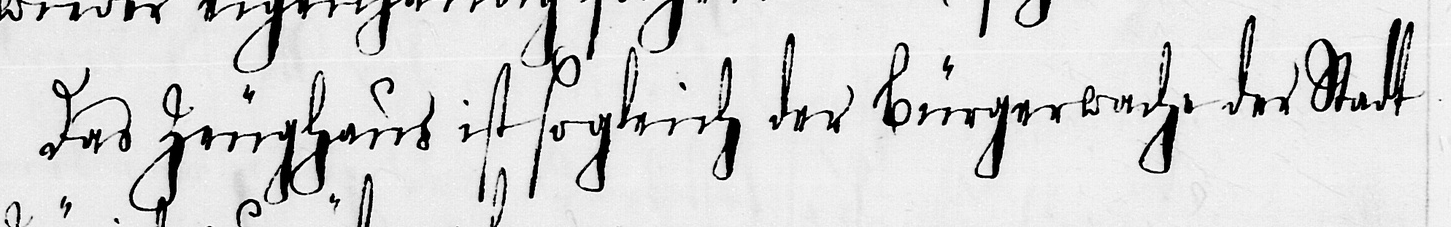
Das Zeughaus ist sogleich der Bürgerwache der Stadt
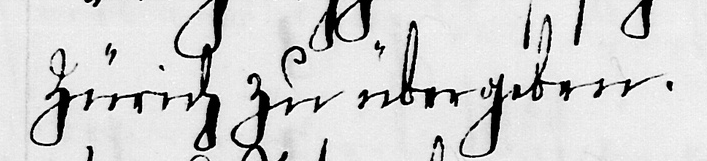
Zürich zu übergeben.
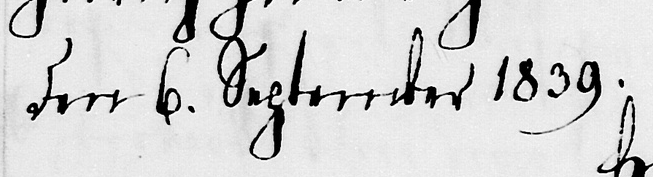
Den 6. September 1839.
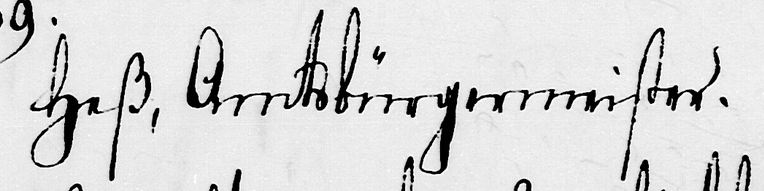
Heß, Amtsbürgermeister.
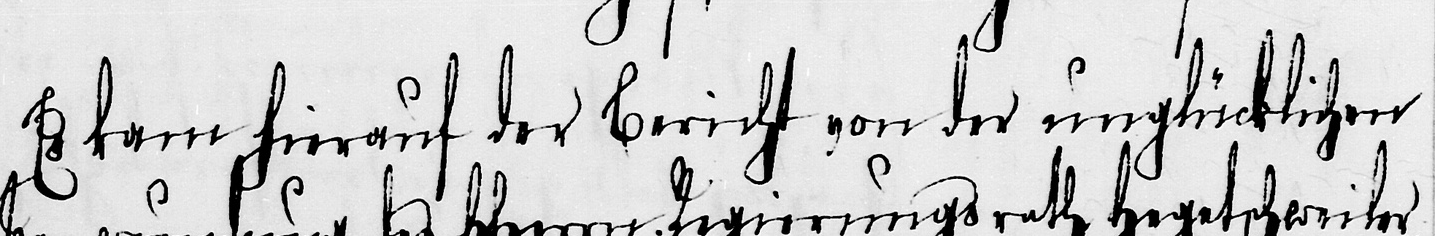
Es kam hierauf der Bericht von der unglücklichen
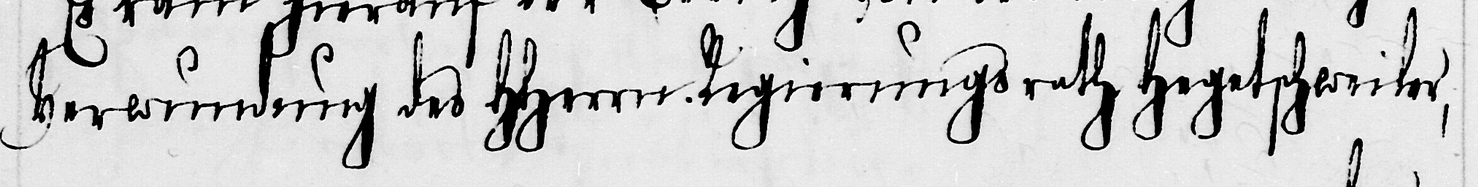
Verwendung des HHerrn Regierungsrath Hegetschweiler,
